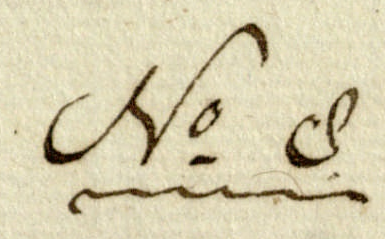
No 8.
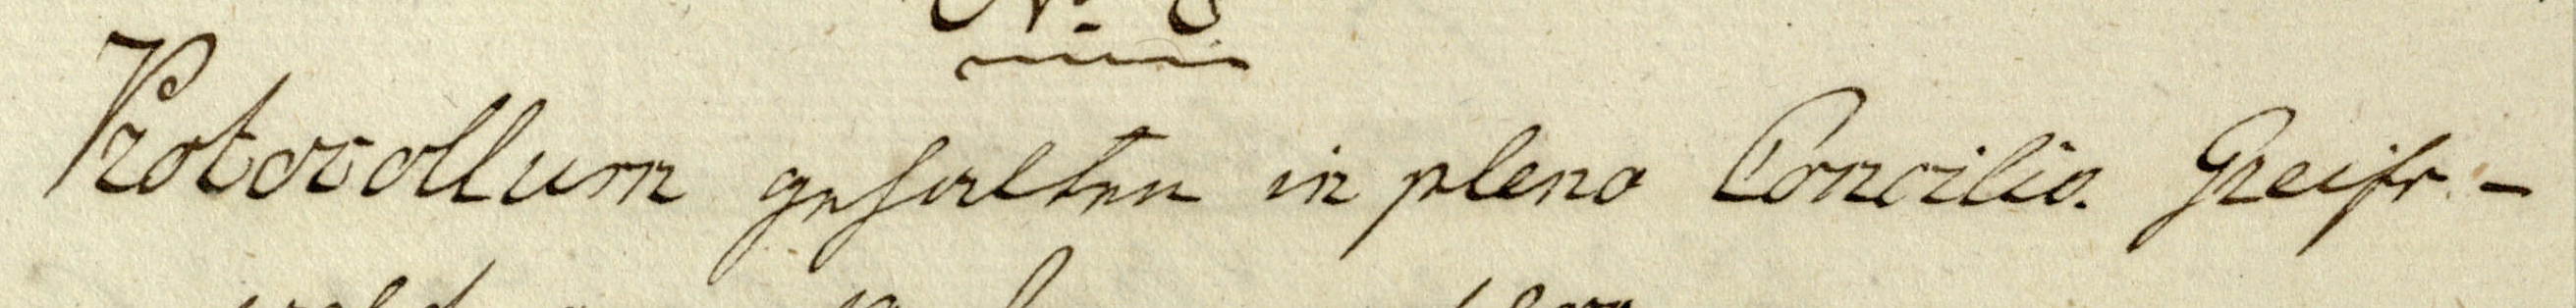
Protocollum gehalten in pleno Concilio Greifs¬
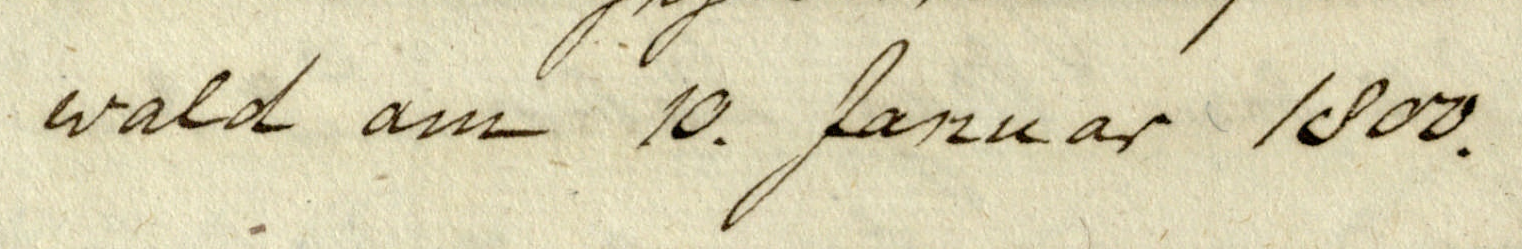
wald am 10. Januar 1800.
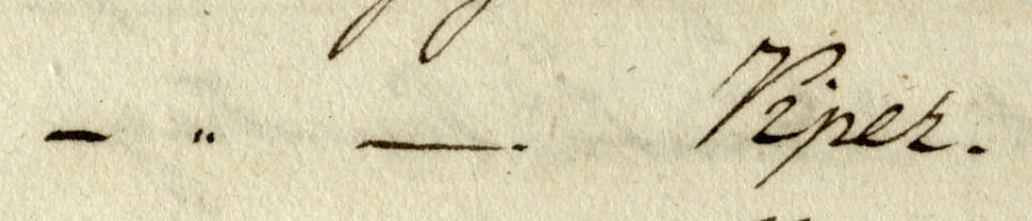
Piper.
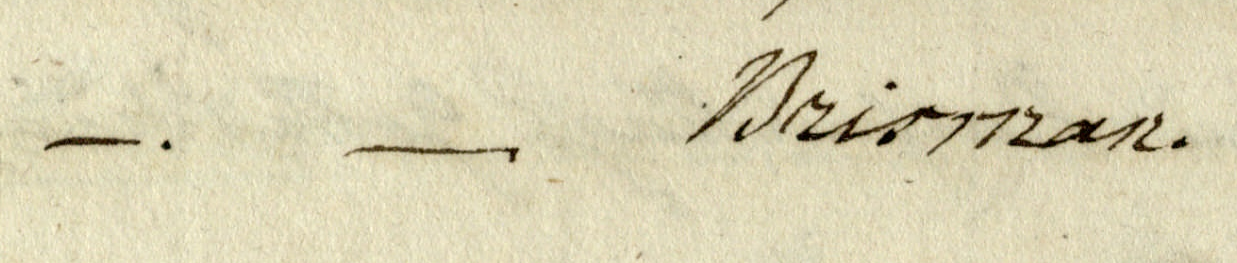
Brisman.
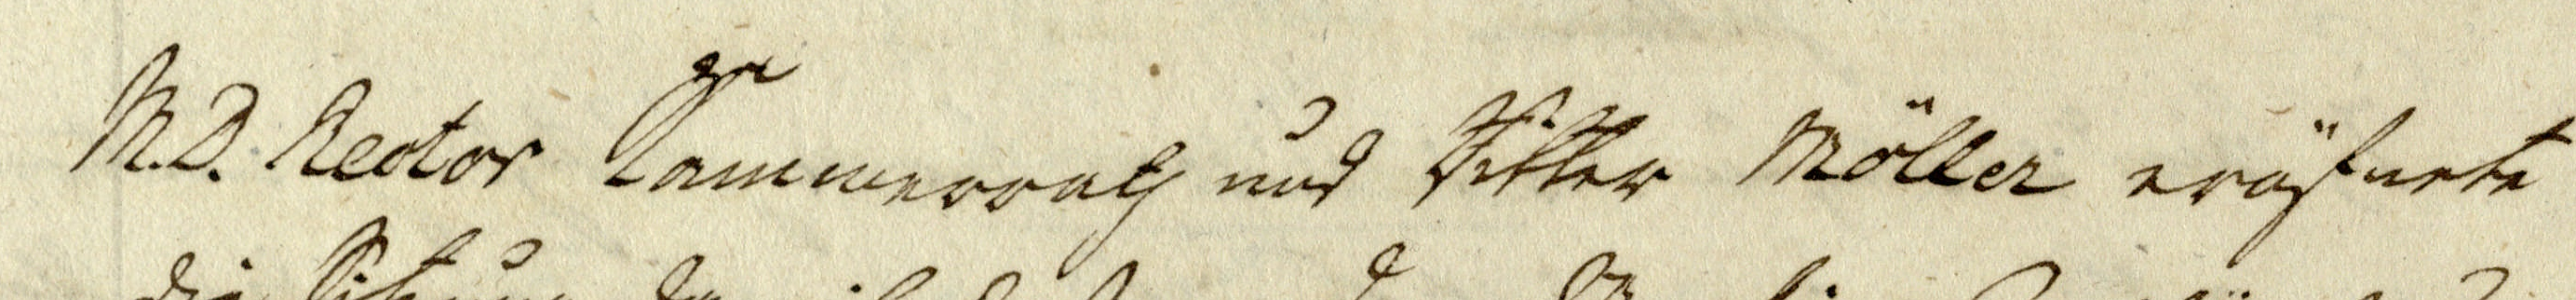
M. Rector Kammerrath und Ritter Möller eröfnete
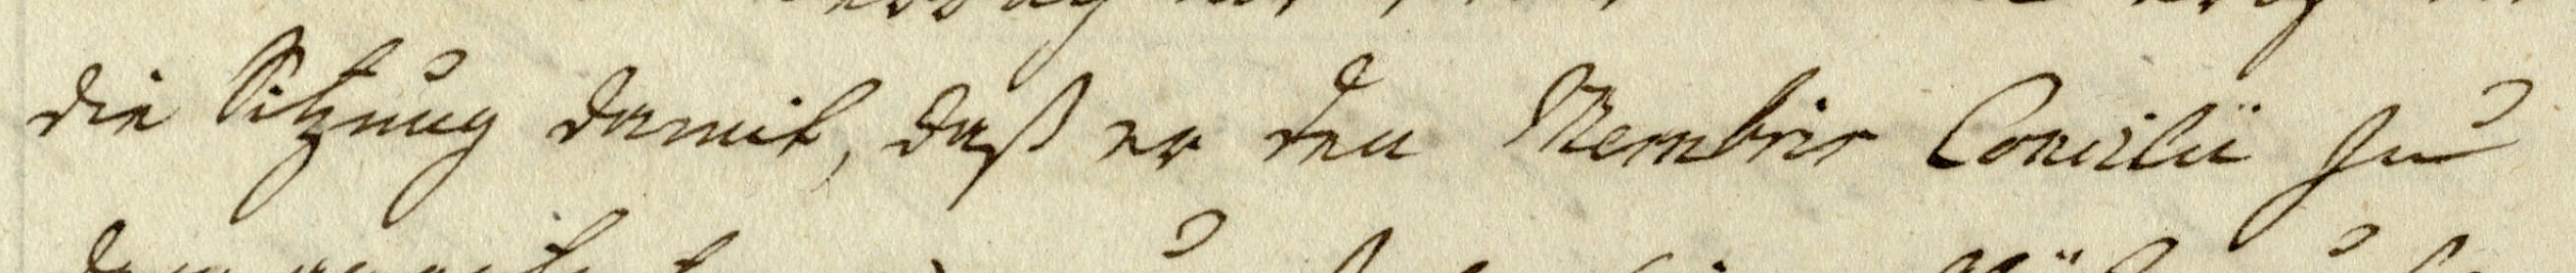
die Sitzung damit, daß er den Membris Concilii zu
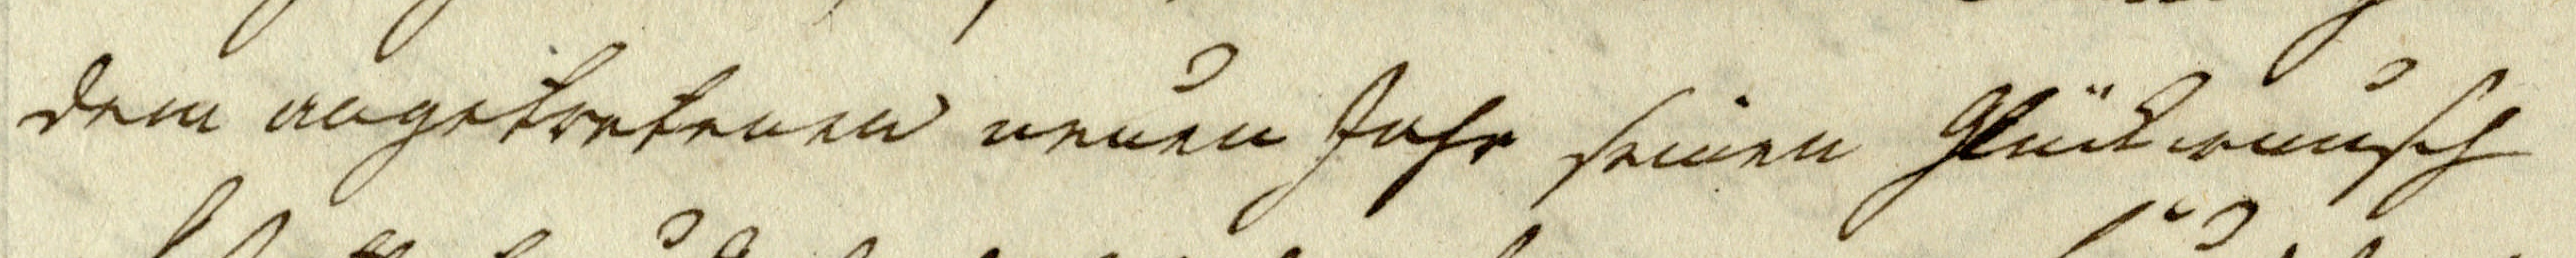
dem angetretenen neuen Jahr seinen Glückwunsch
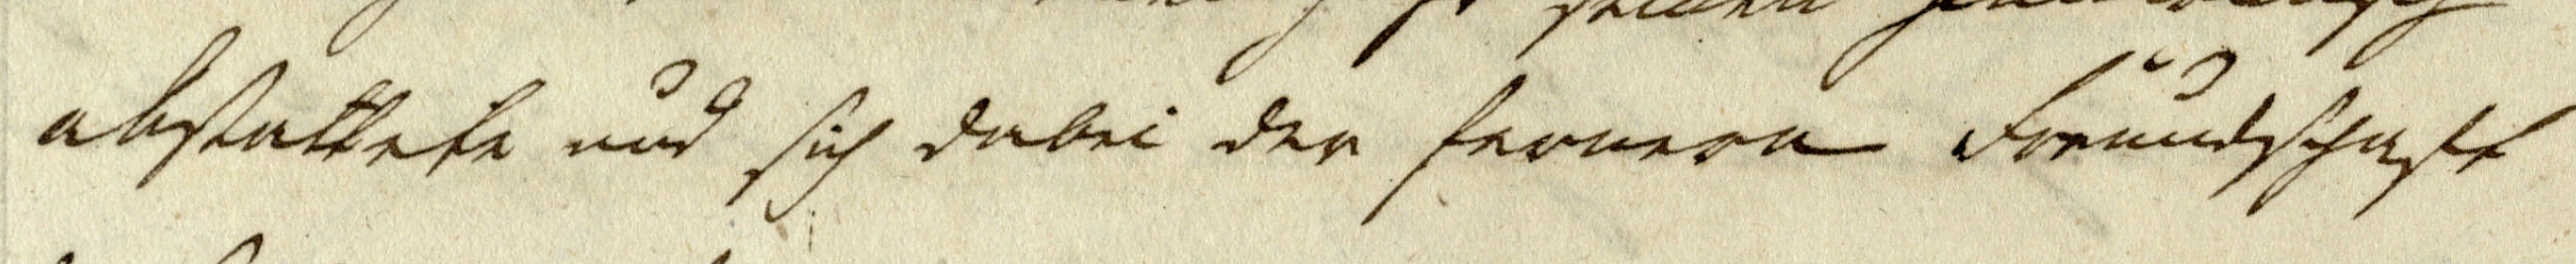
abstattete und sich dabei der fernern Freundschaft
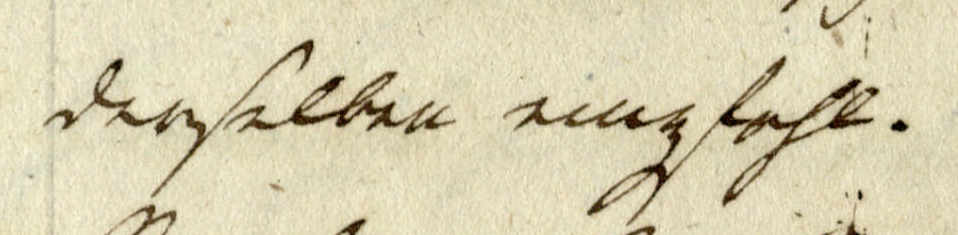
derselben empfahl.
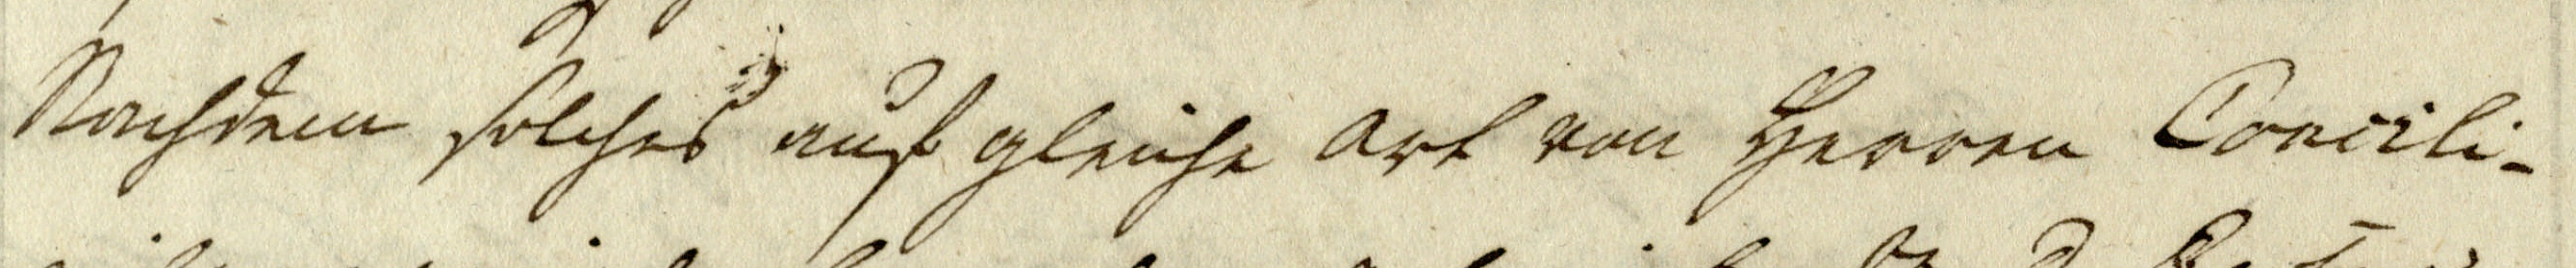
Nachdem solches auf gleiche Art von Herren Concili¬
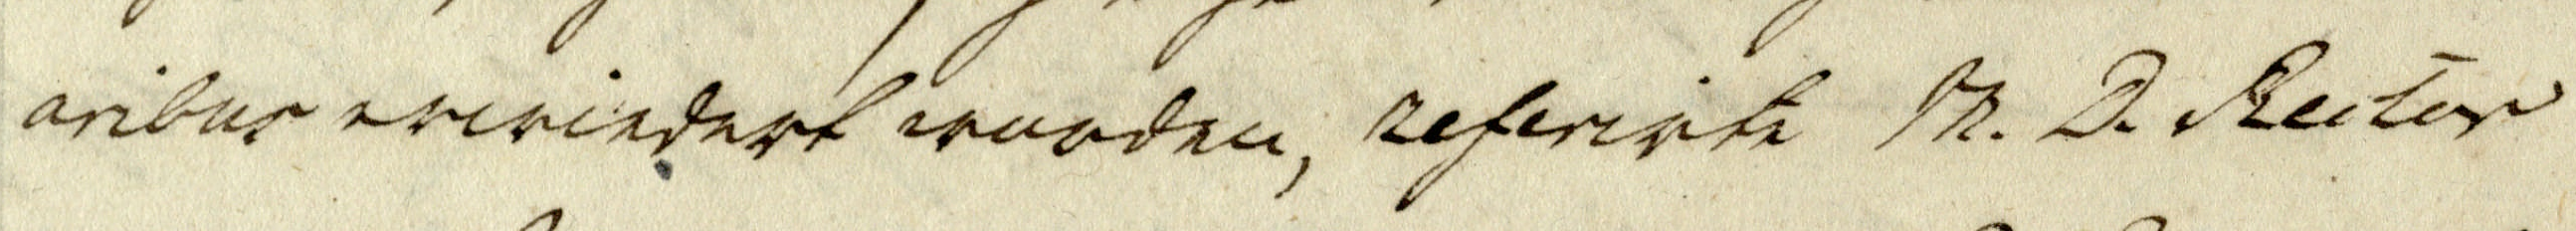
aribus erwiedert worden, referirte M. D. Rector
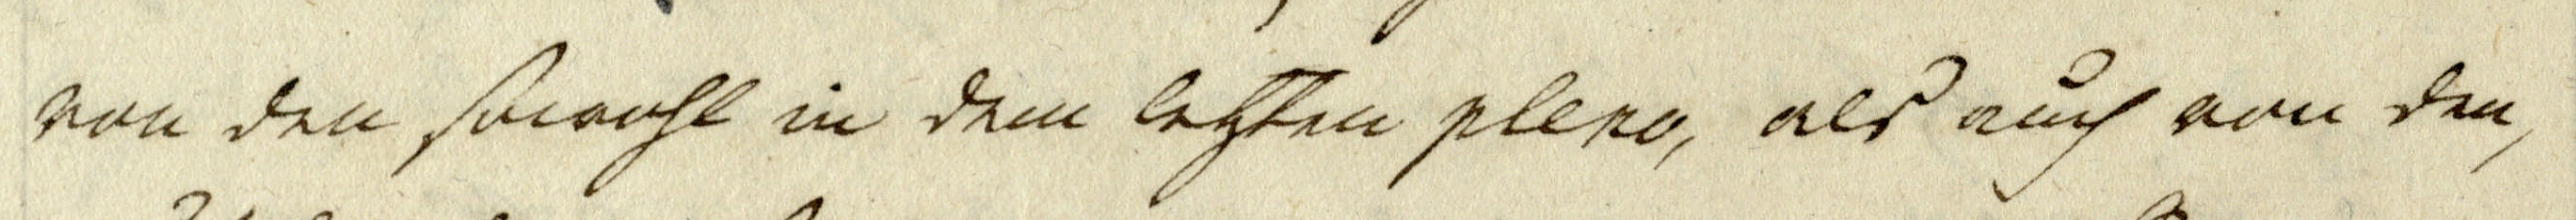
von den sowohl in dem letzten pleno, als auch von den,
